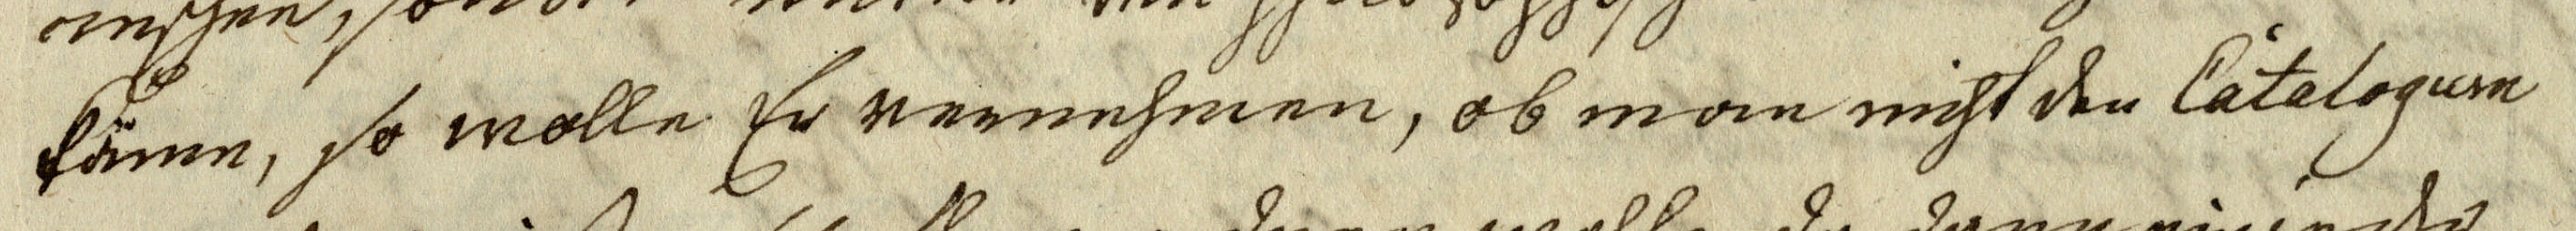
käme, so wolle Er vernehmen, ob man nicht den Catalogum
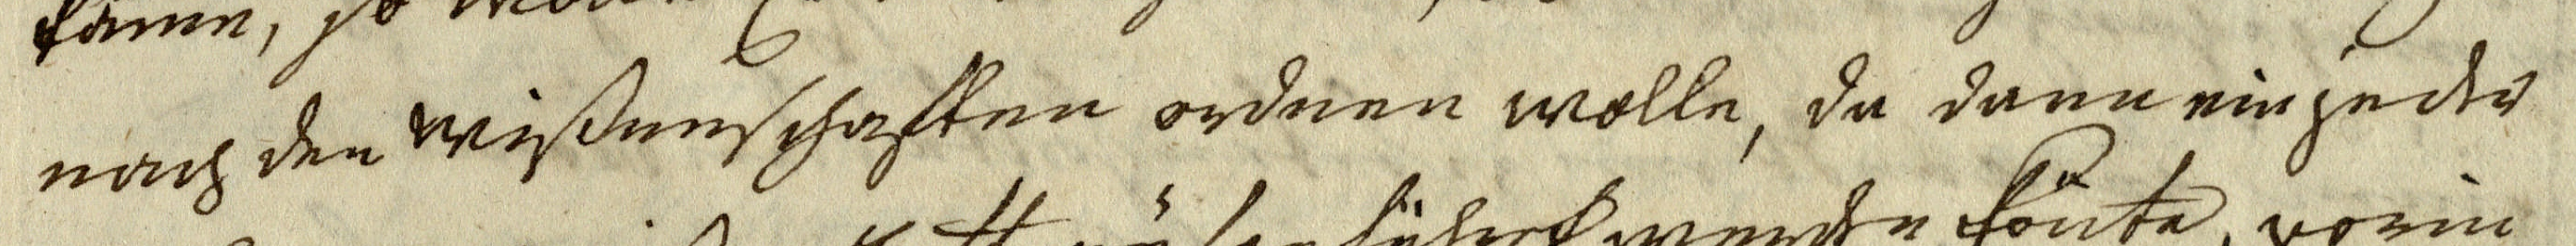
nach den Wissenschaften ordnen wolle, da dann ein jeder
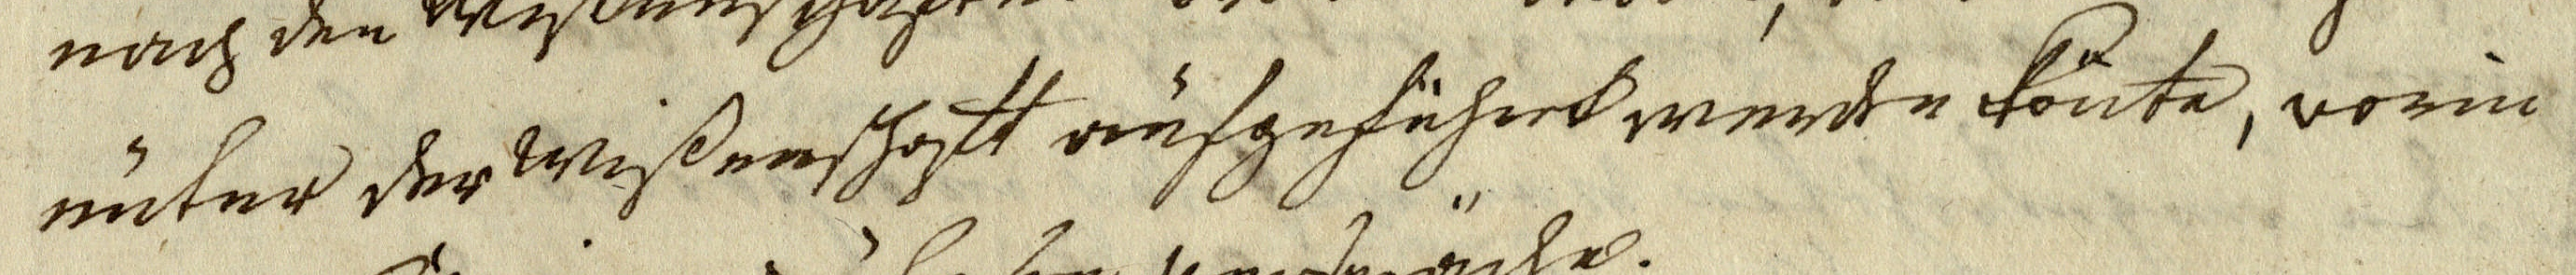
unter der Wissenschaft aufgeführet werden könte, worin
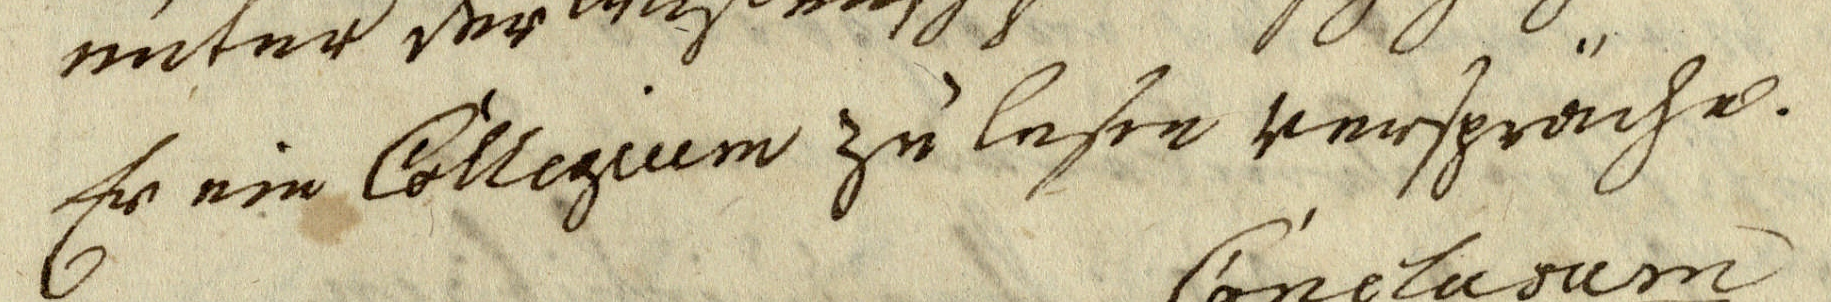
Er ein Collegium zu lesen verspräche.
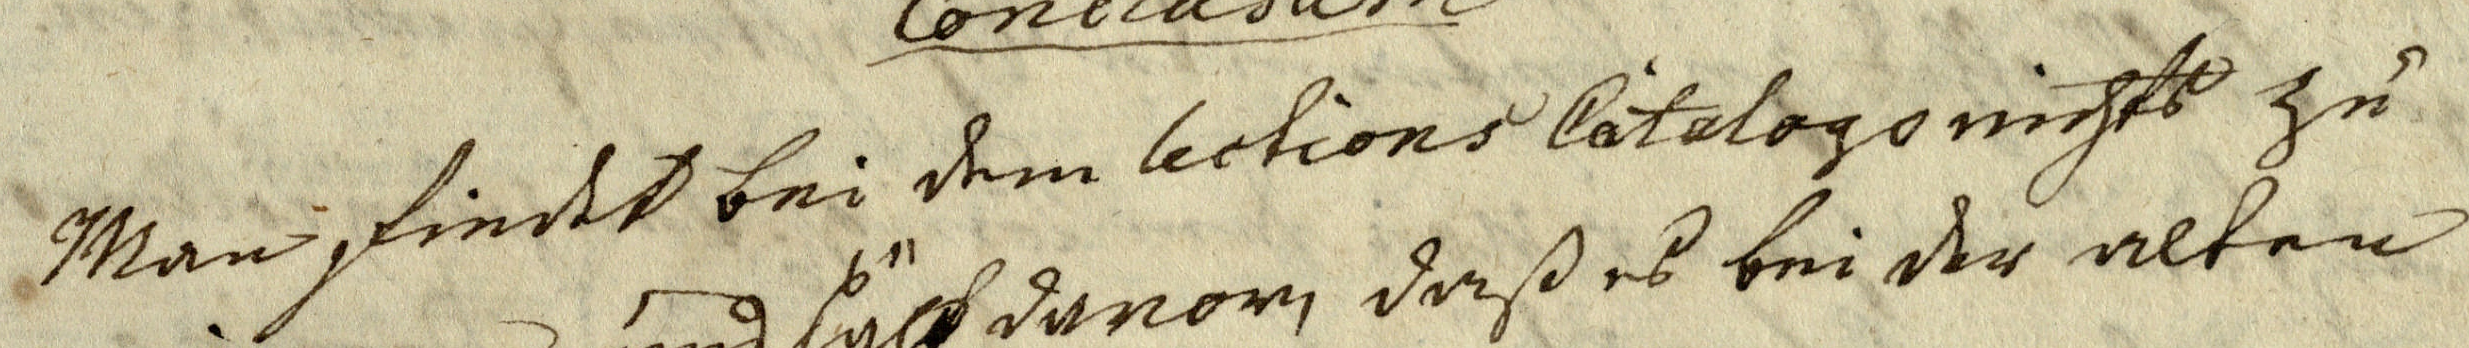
Man findet bei dem lections Catalogo nichts zu
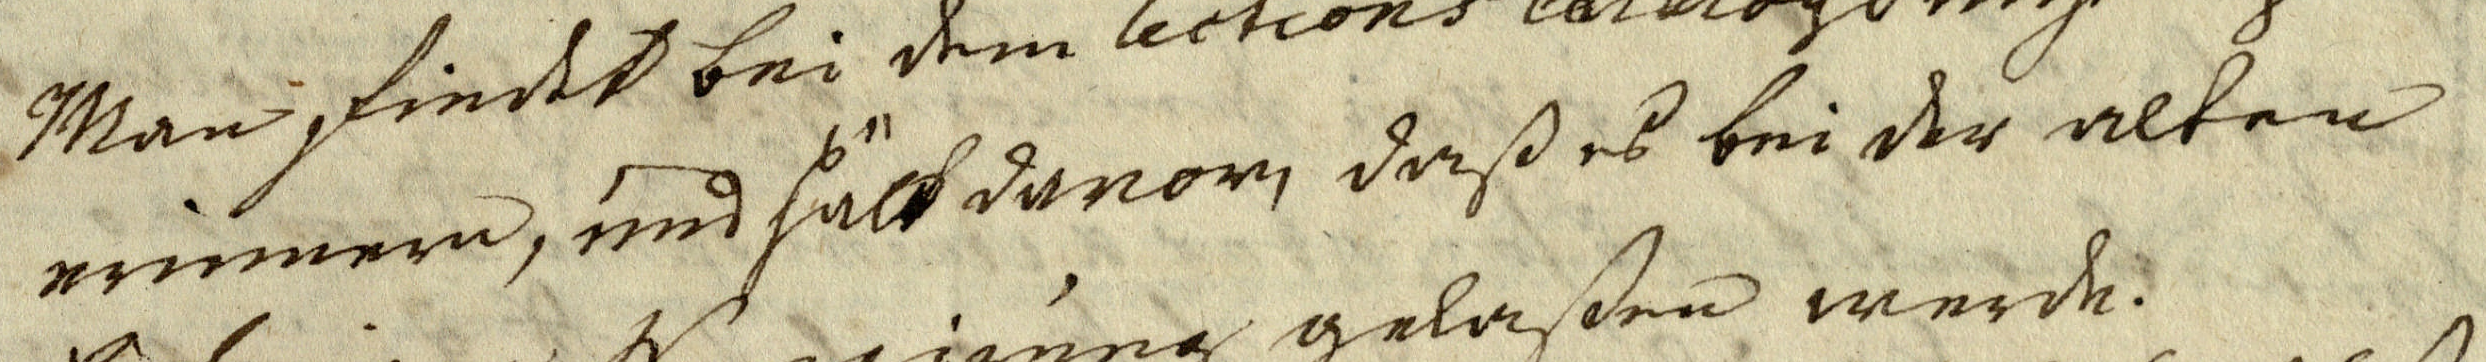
erinnern, und hält davor, daß es bei der alten
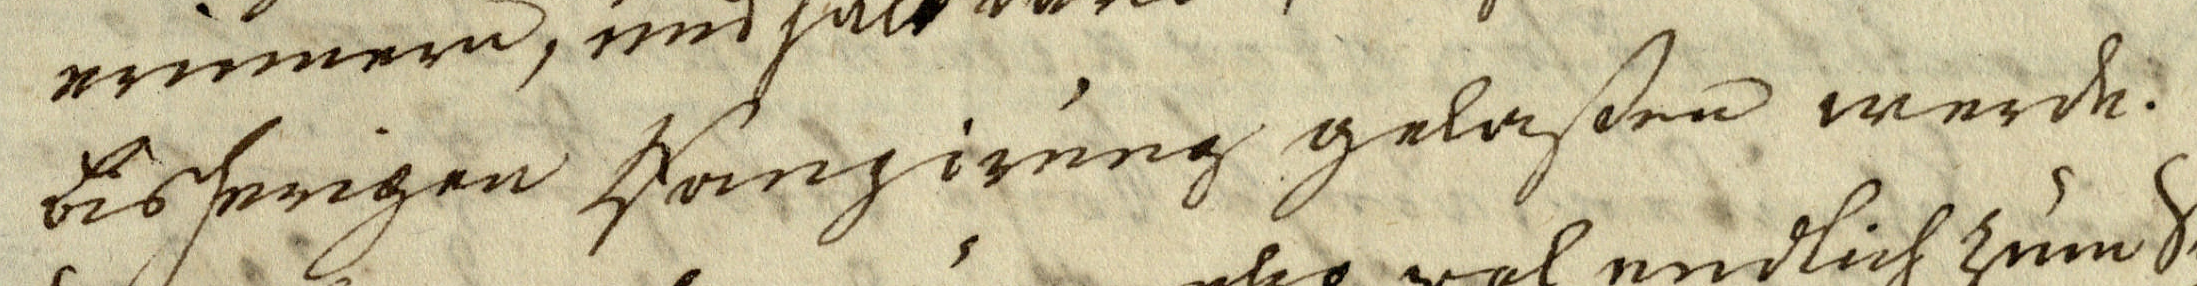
bisherigen Rangirung gelaßen werde.
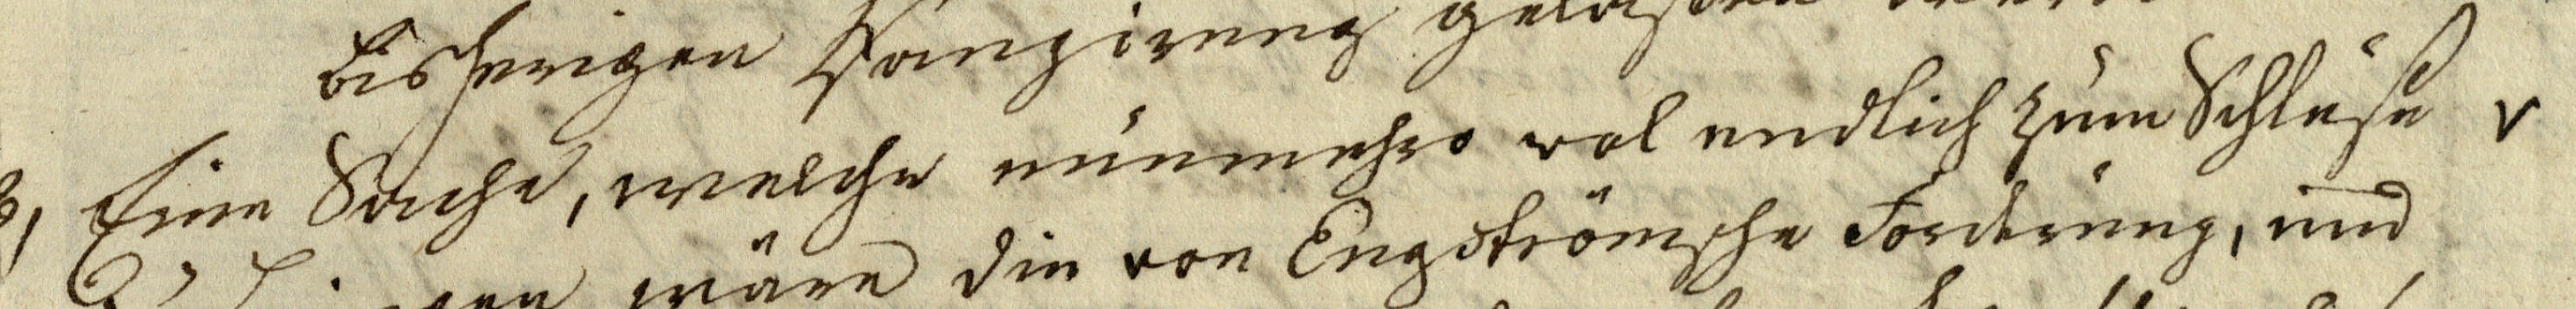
8. Eine Sache, welche nunmehro wol endlich zum Schluße
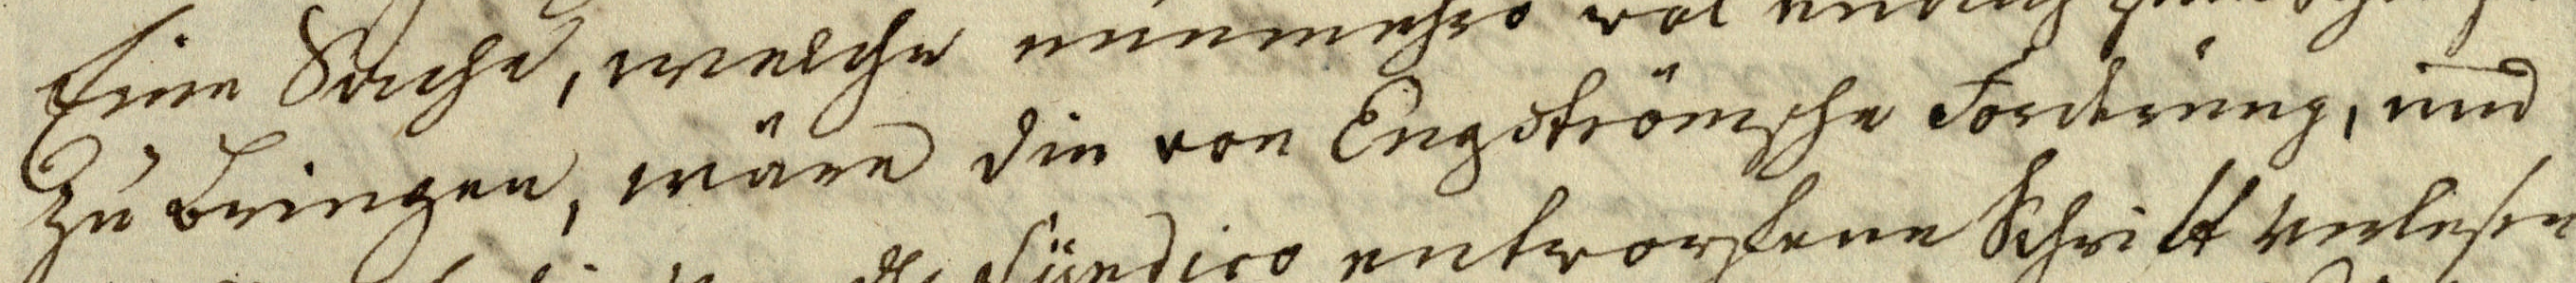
zu bringen, wäre die von Engströmsche Forderung, und
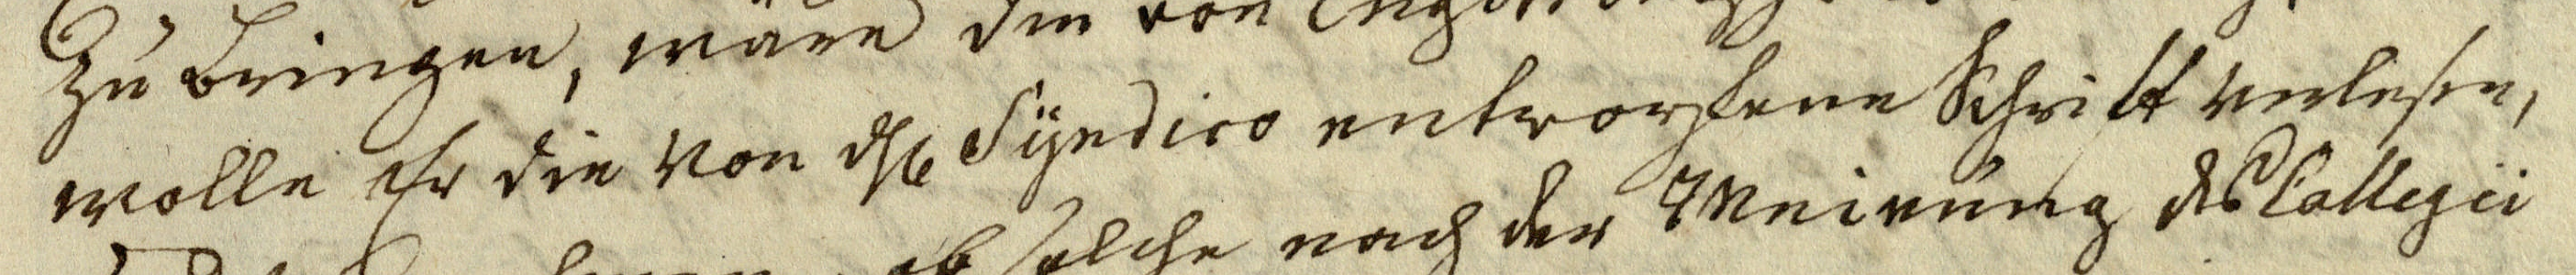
wolle Er die von dh Sÿndico entworfene Schrift verlesen,
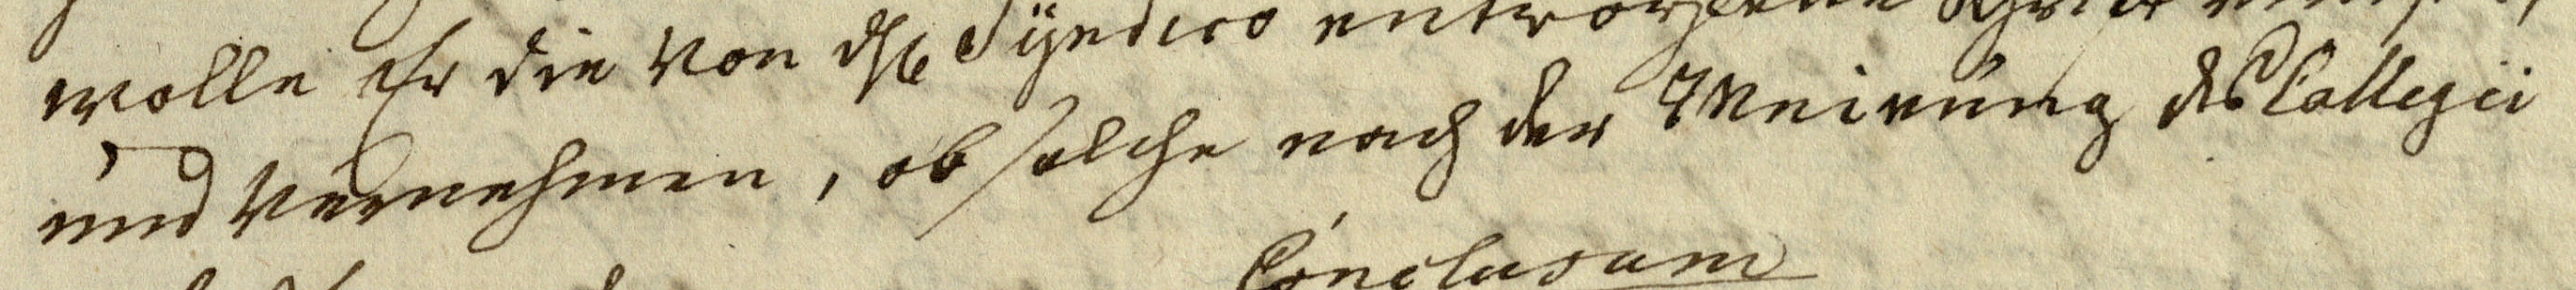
und vernehmen, ob solche nach der Meinung des Collegii
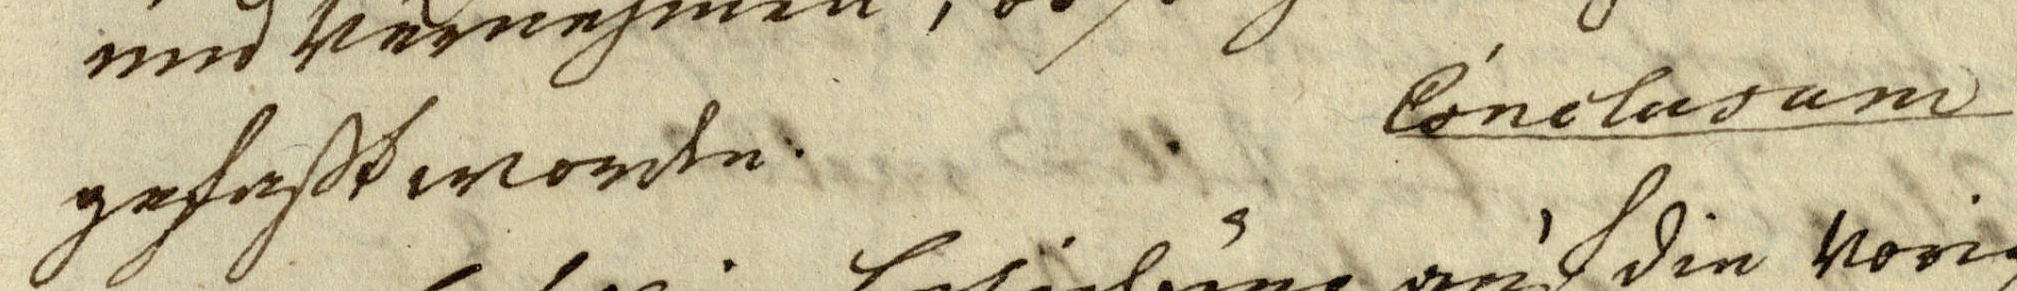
gefaßt worden. Conclusum
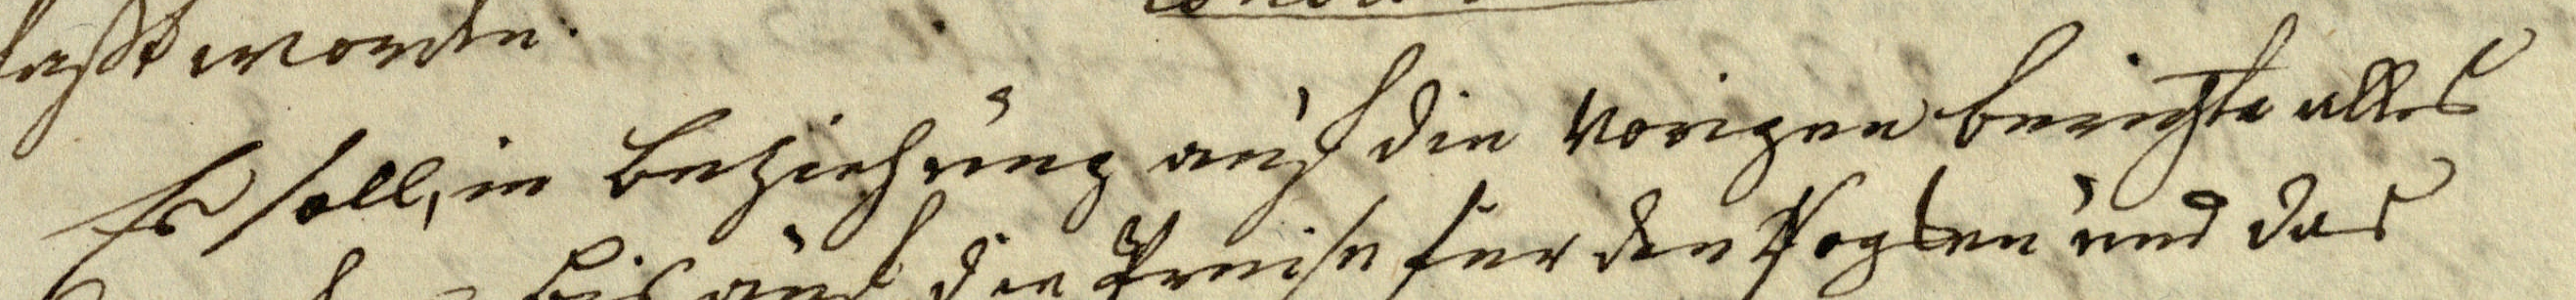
Es soll, in Beziehug auf die vorigen Berichte alles
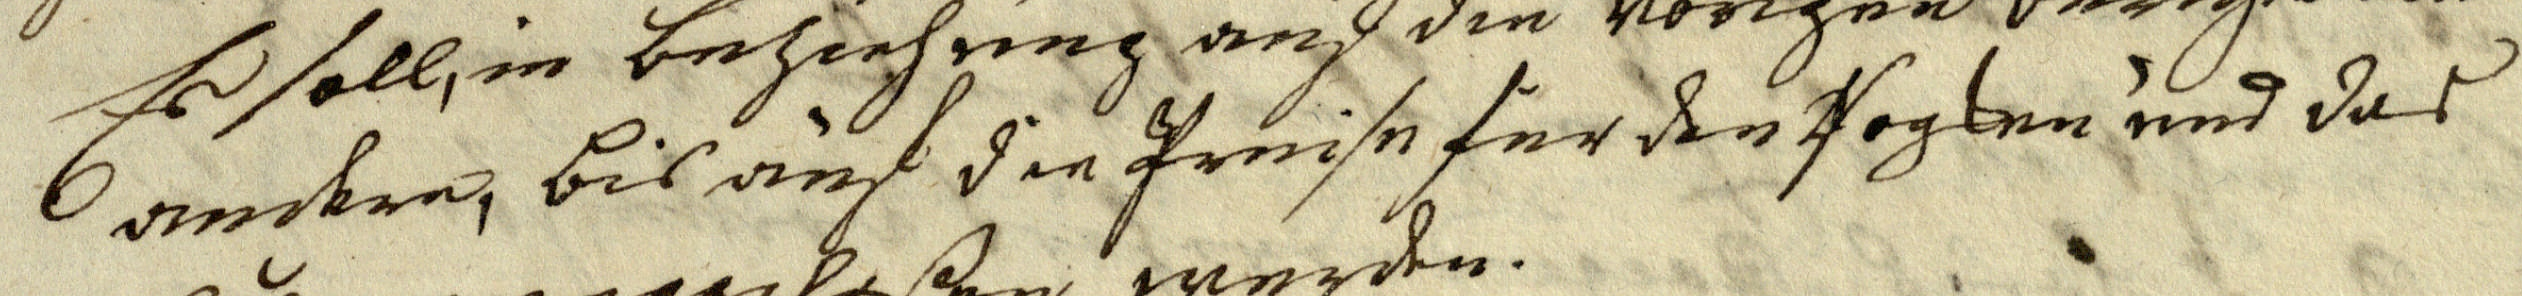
andere, bis auf die Preise für den Rogken und das
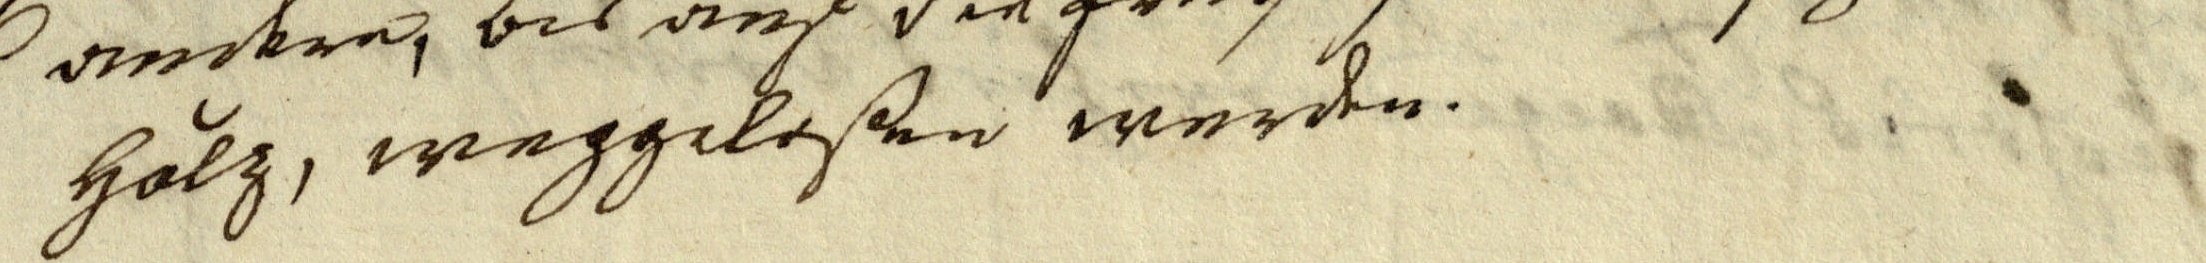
Holz, weggelaßen werden.
